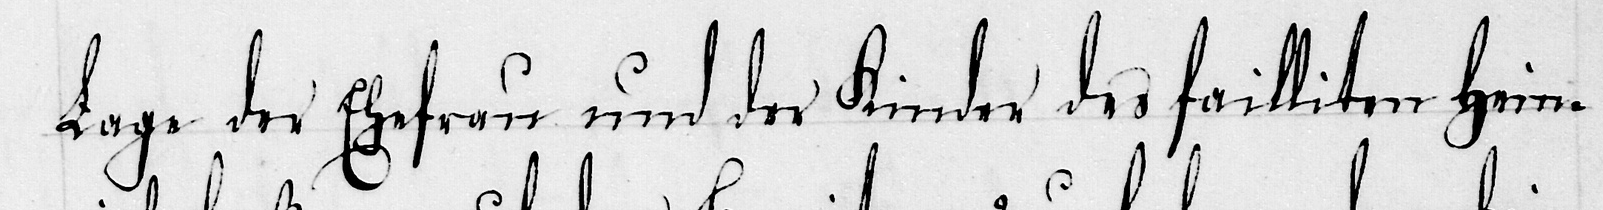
Lage der Ehefrau und der Kinder des failliten Hein¬
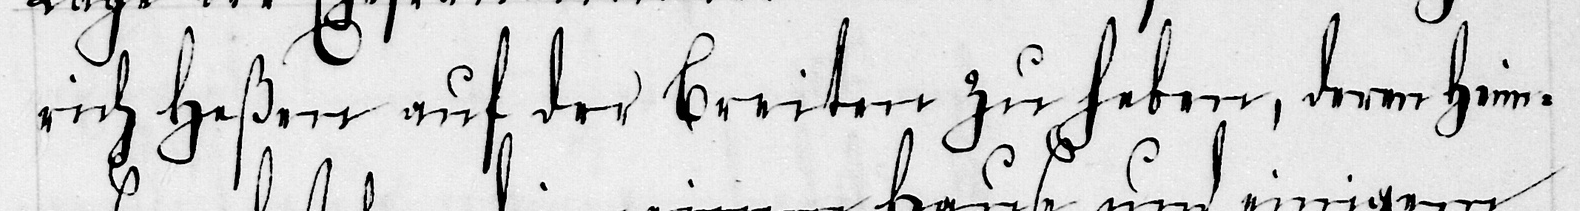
rich Heßen auf der Breiten zu heben, deren Heim¬
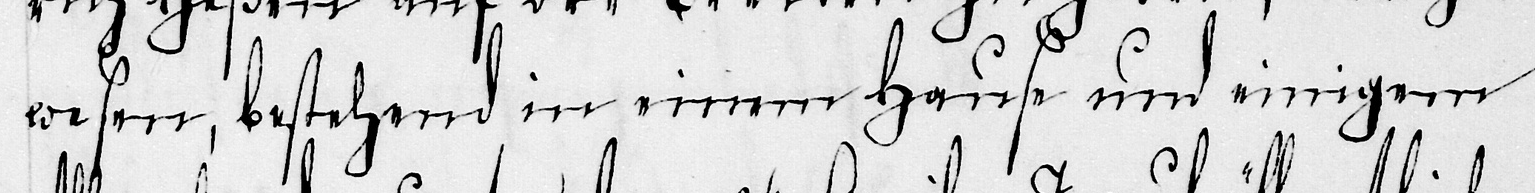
wesen, bestehend in einem Hause und einigem
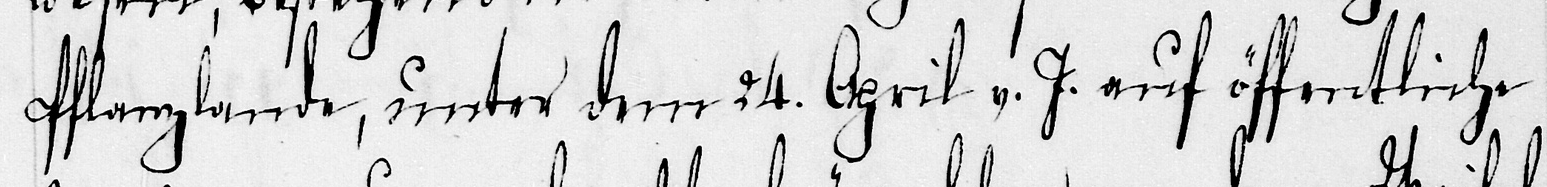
Pflanzlande, unter dem 24. April v. J. auf öffentliche
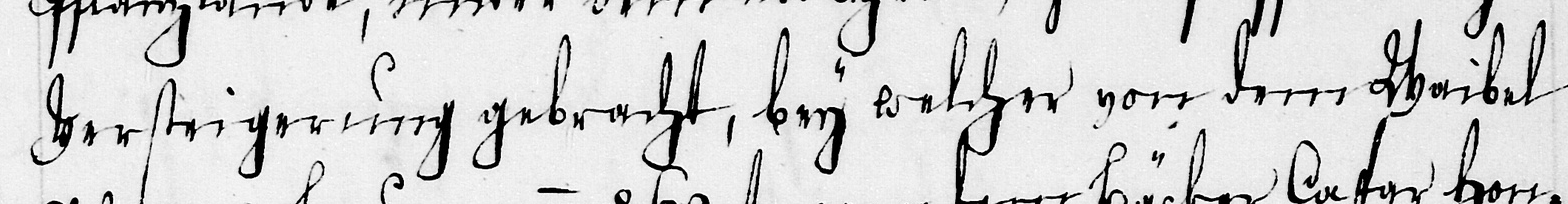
Versteigerung gebracht, bey welcher von dem Waibel
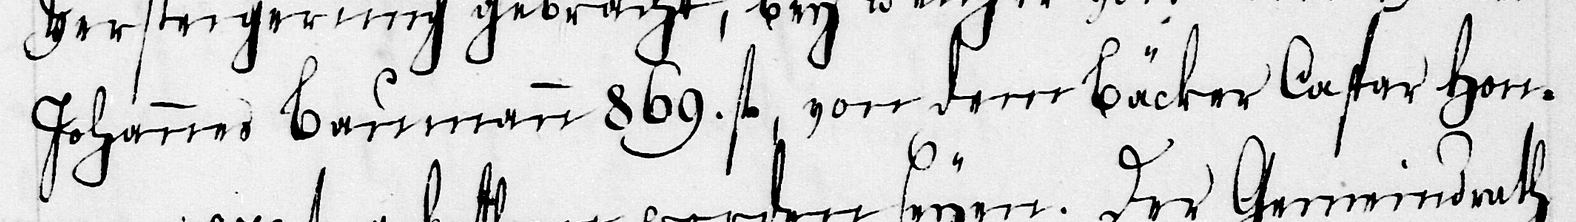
Johannes Baumann 869. fl., von dem Bäcker Caspar Hon¬
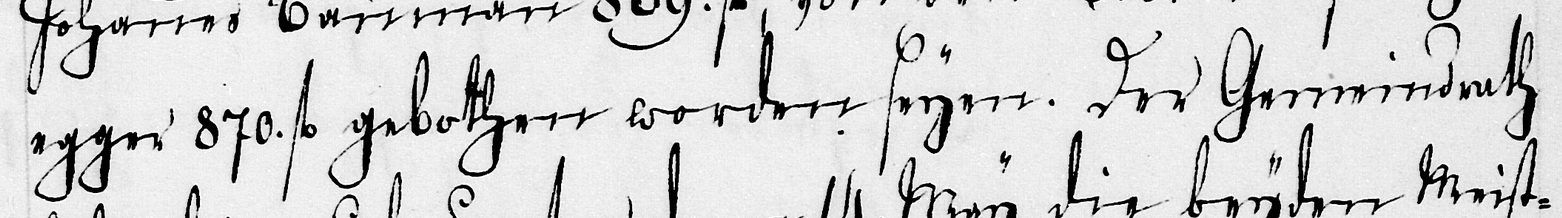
egger 870. fl. gebothen worden seyen. Der Gemeindrath
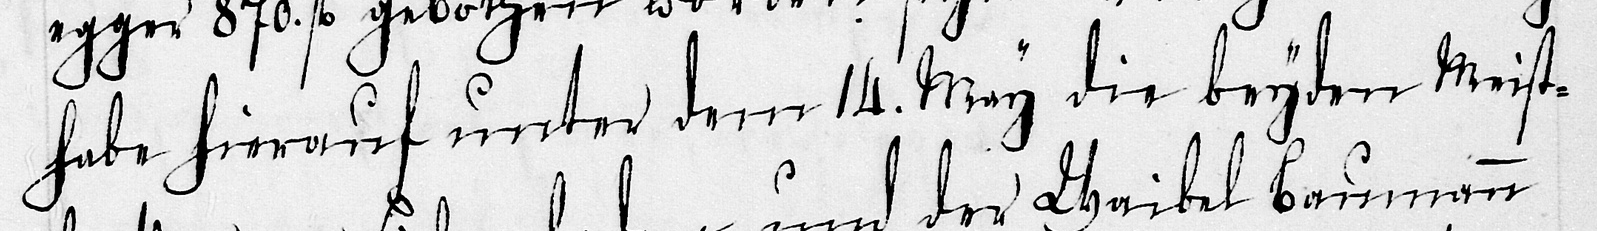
habe hierauf unter dem 14. May die beyden Meist¬
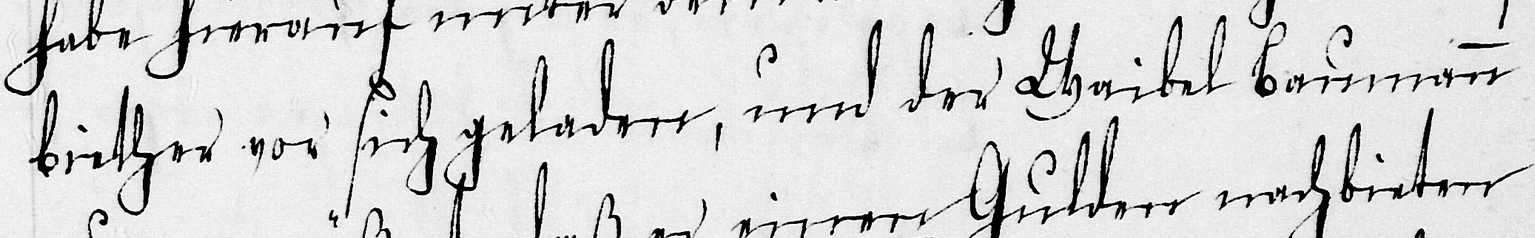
biether vor sich geladen, und der Waibel Baumann
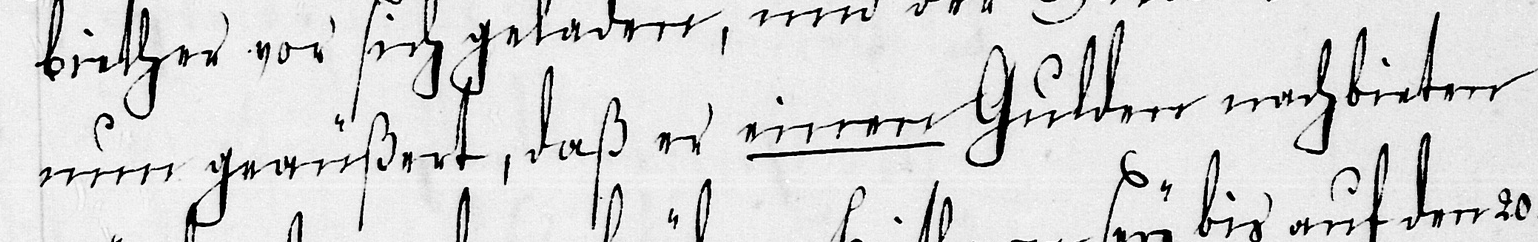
nun geäußert, daß er einen Gulden nachbieten
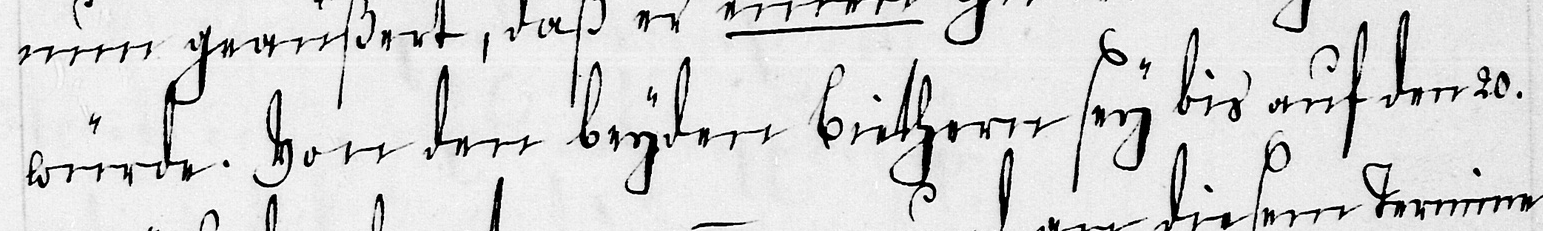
würde. Von den beyden Biethern sey bis auf den 20.
